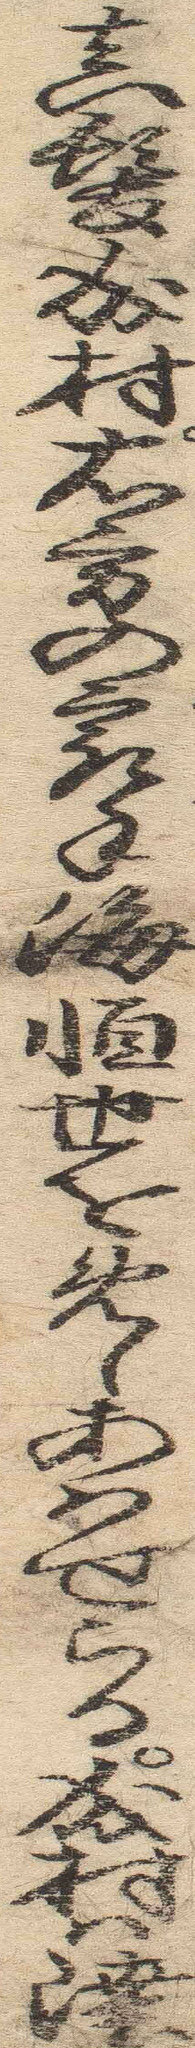真髪成村。右方の最手海恒世をめしあはせらる。成村は陸
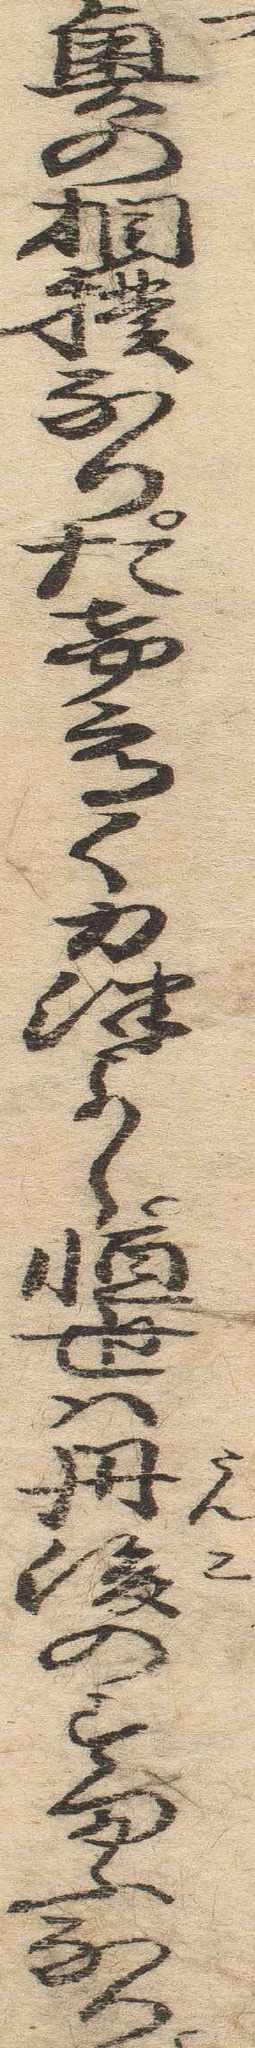奥の相撲なり。たけ高く力つよし。恒世は丹後のすまふなり、
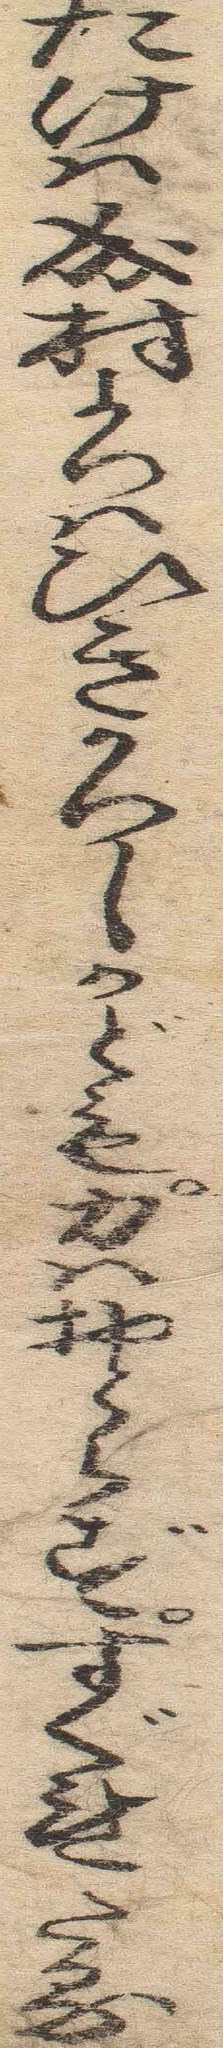たけは成村よりはひきかはしかとも力はおとらず。すぐれたる
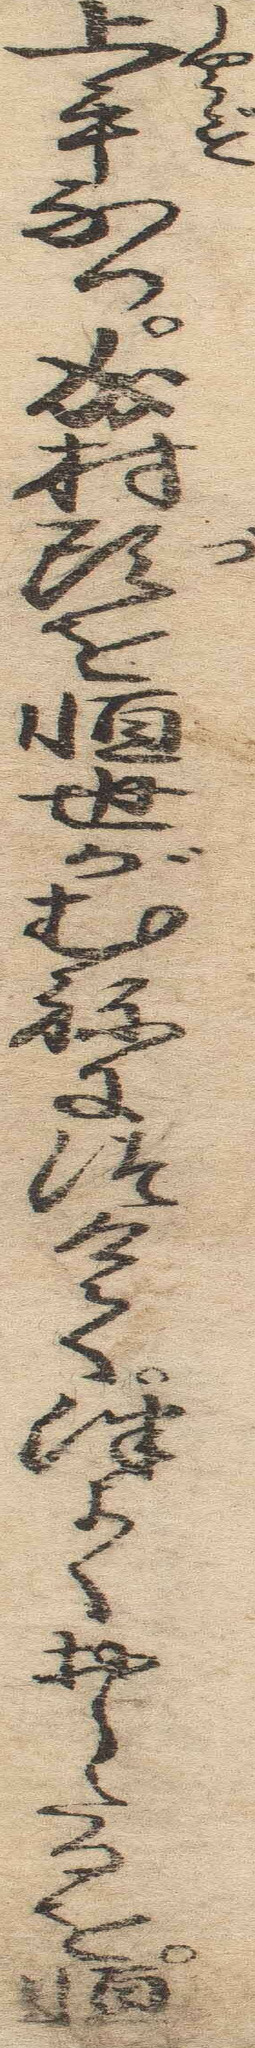上手なり。成村頭を恒世がむねにつけて。つよくおしくるを恒
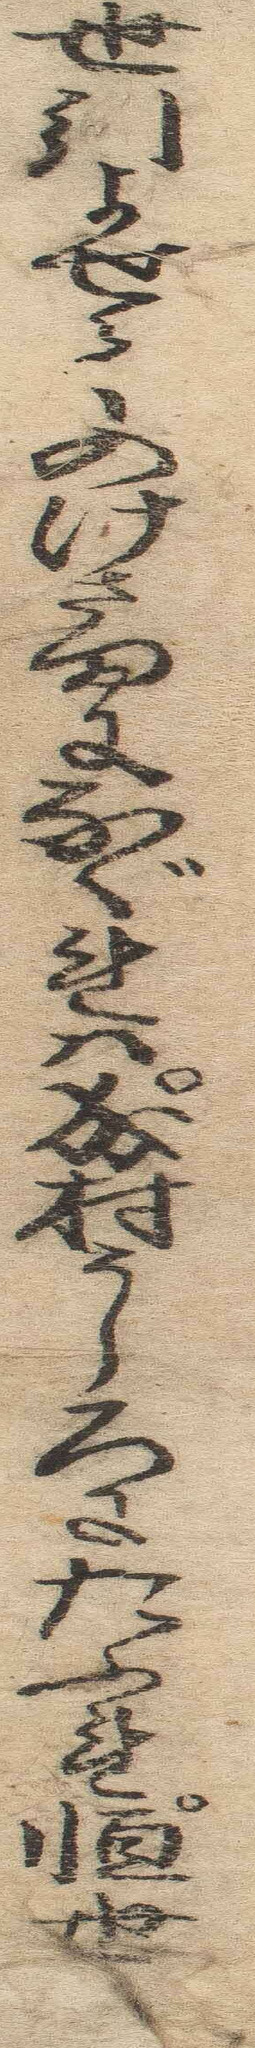世引よせてのけさまになぐれば。成村うしろにたふれ恒世其上

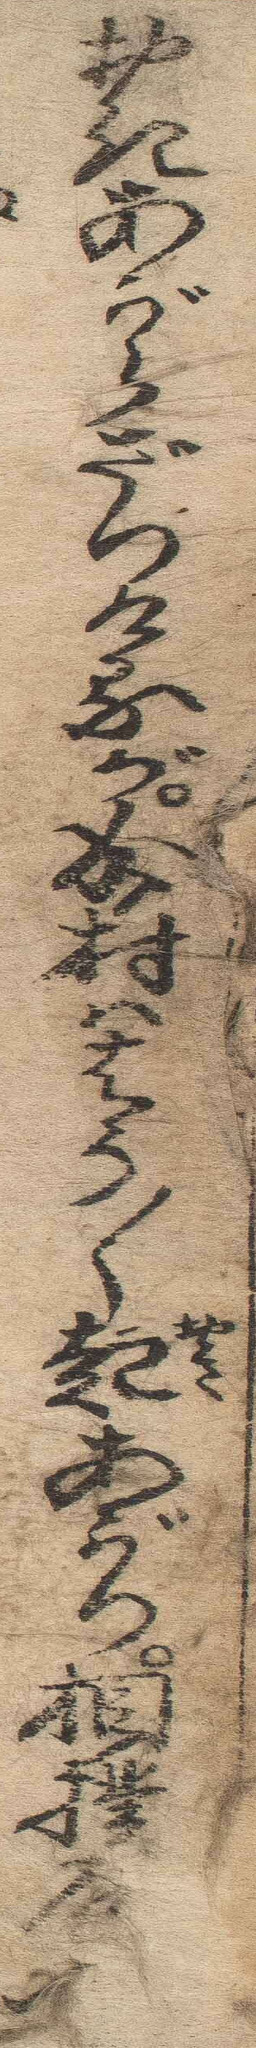おきあがらざりけるが。成村ははう〳〵起あがり。相撲部屋へ入けり
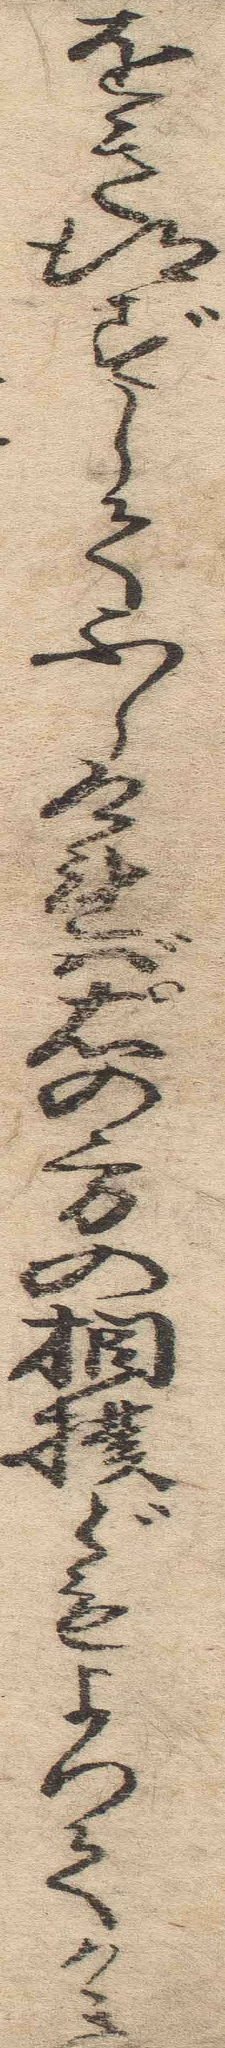をき得ずしてふしければ。右の方の相撲どもよつてかき
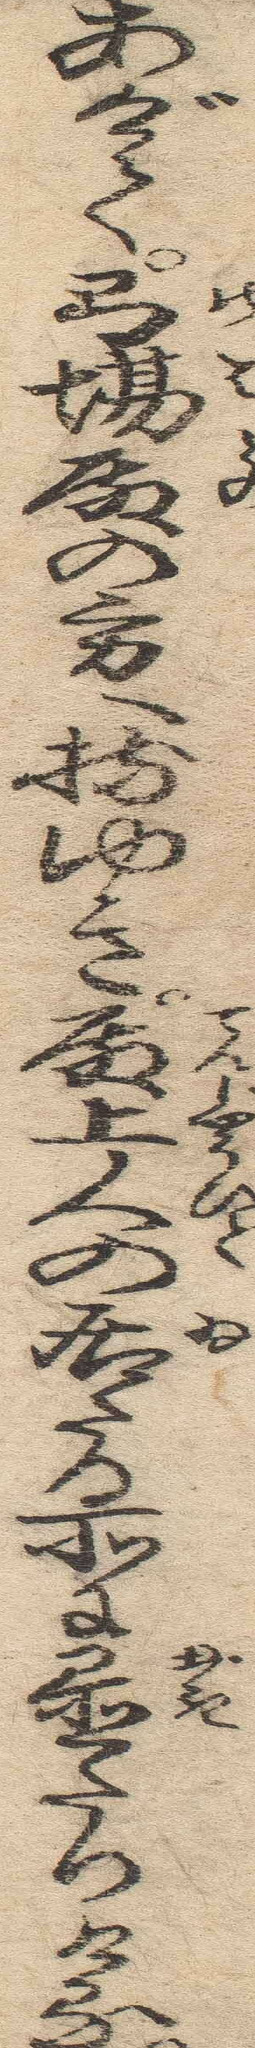あげて。弓場殿の方へ持ゆき。殿上人の居たる所に置たりける。
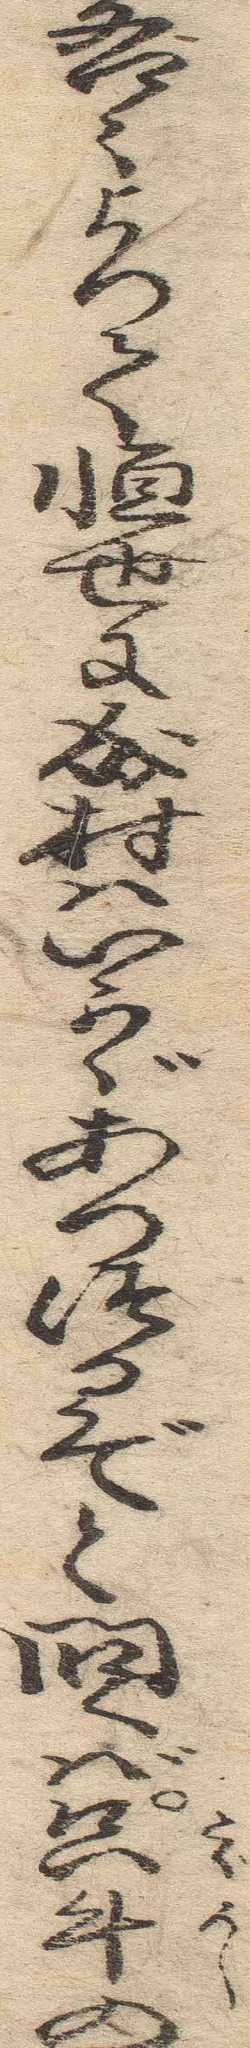各々よつて恒世に成村はいかゞありつるぞと問へば。只牛の
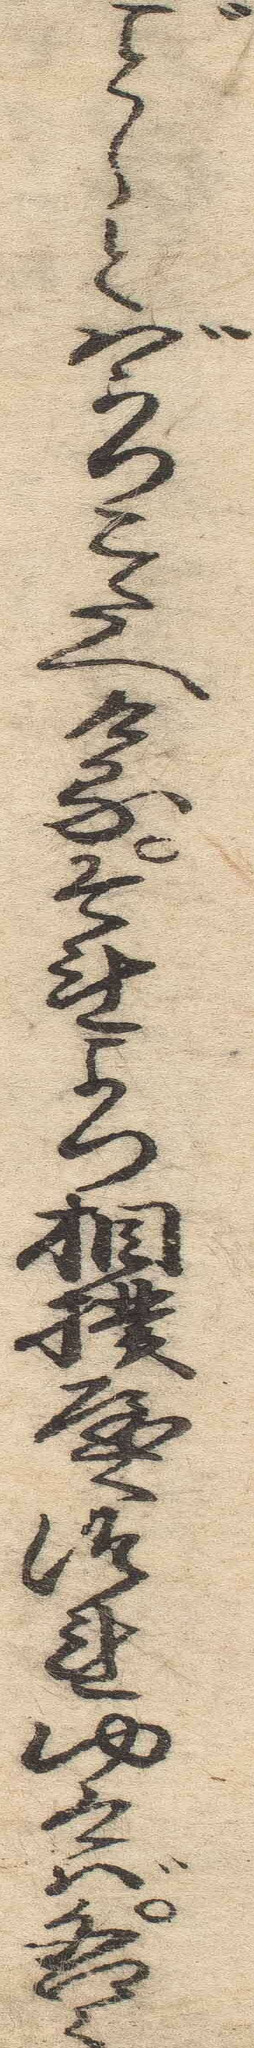ごとしとばかりこたへける。それより相撲殿へつれゆけば。各々
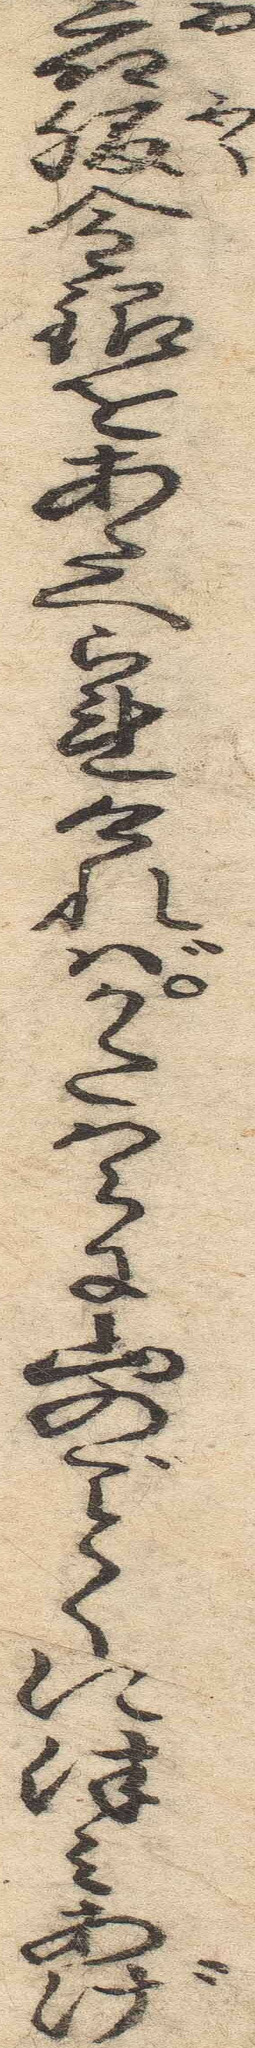衣服金銀をあたへられければ。かたはらに山のごとくにつみあげ
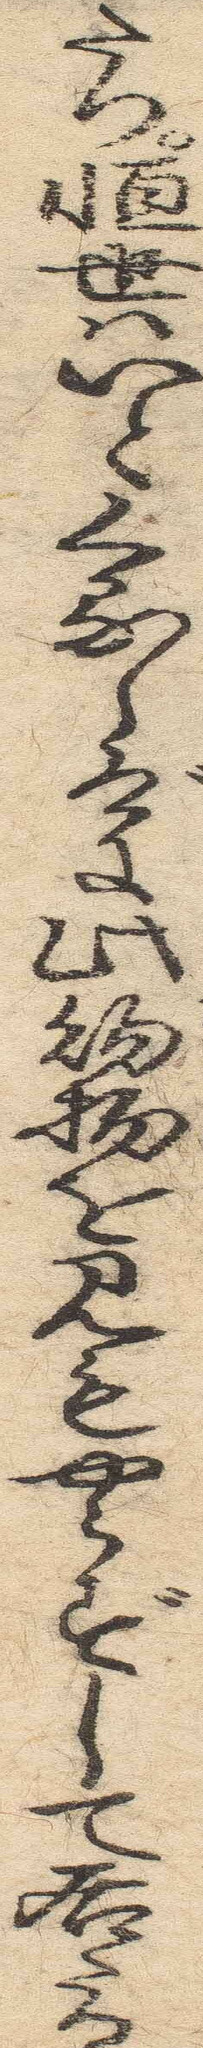たり。恒世はいとくるしげに此賜物を見もやらずして居たる
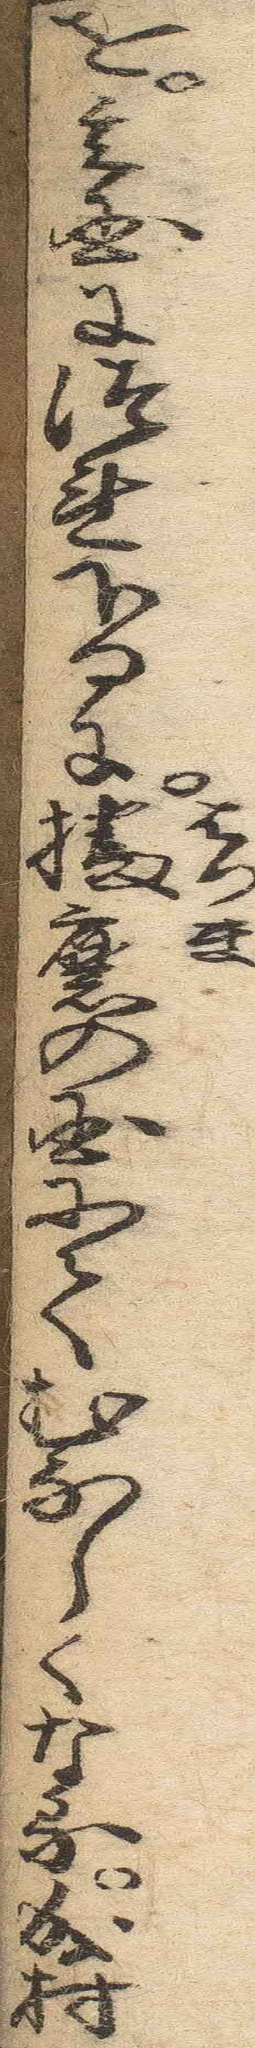を其国につれ下るに。播磨の国にてむなしくなる。成村
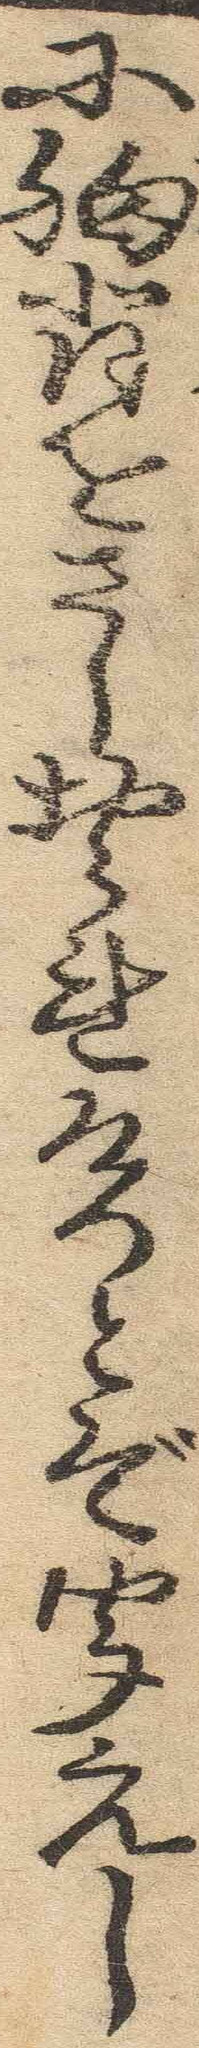に胸背をさしおられけりとぞ聞えし
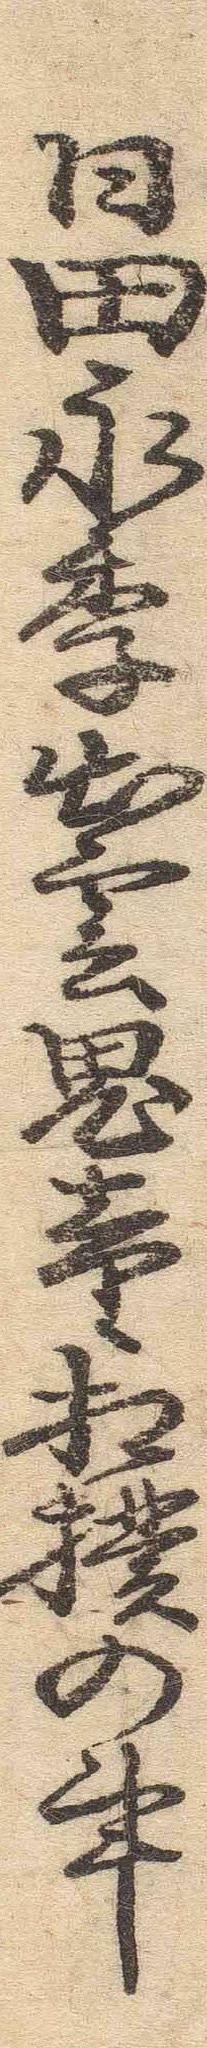日田永季出雲鬼童相撲の事
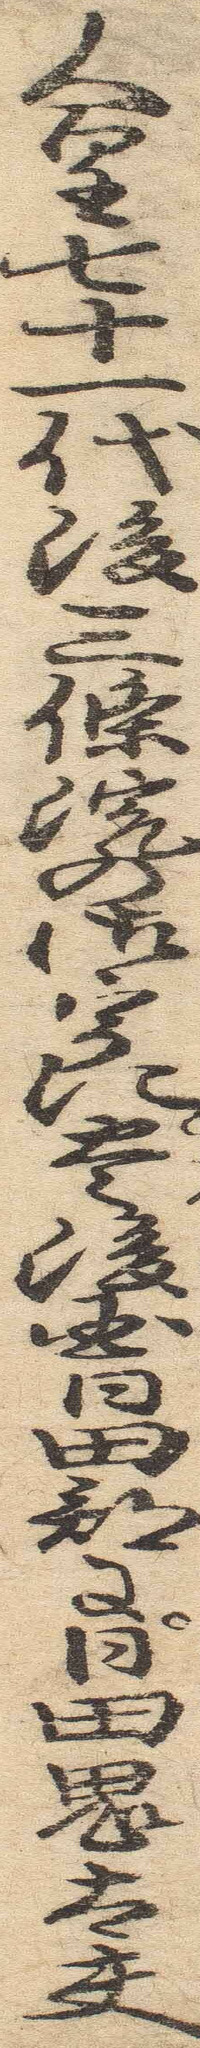人皇七十一代後三條院の御宇に豊後国日田郡に日田鬼太夫
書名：古今相撲大全
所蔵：東京学芸大学附属図書館 国文学研究資料館
